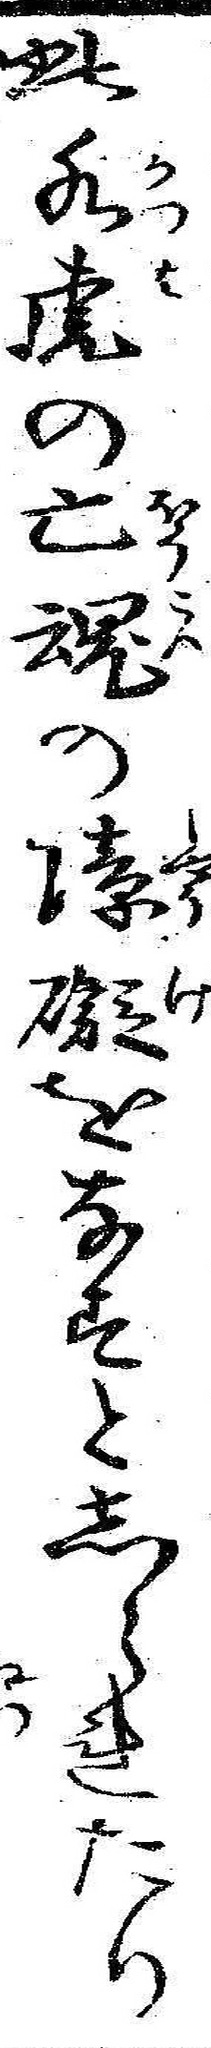此水虎の亡魂の障礙をなすとしられたり
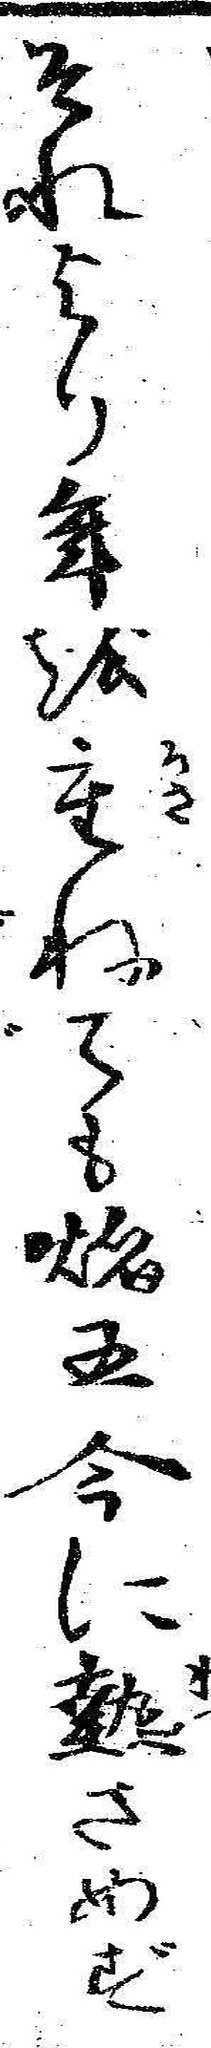それより年を重ねても焰王今に熱さめず
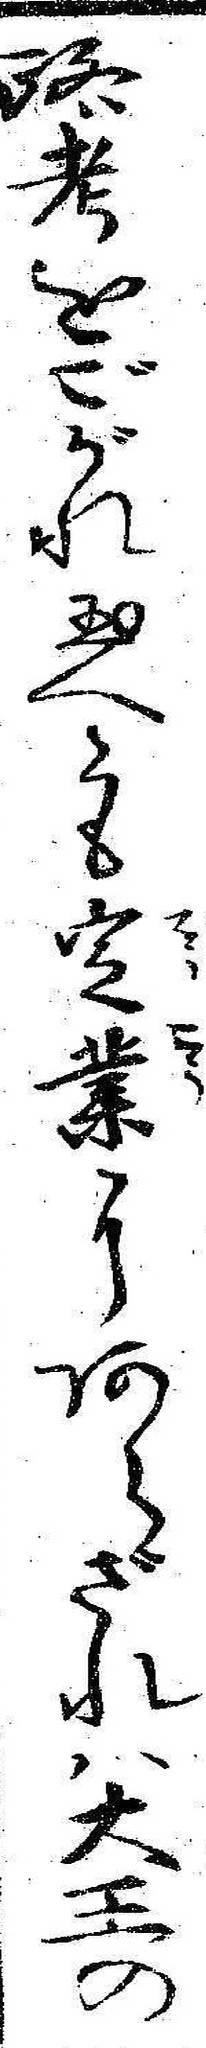路考をごがれ玉へとも定業にあらざれは大王の

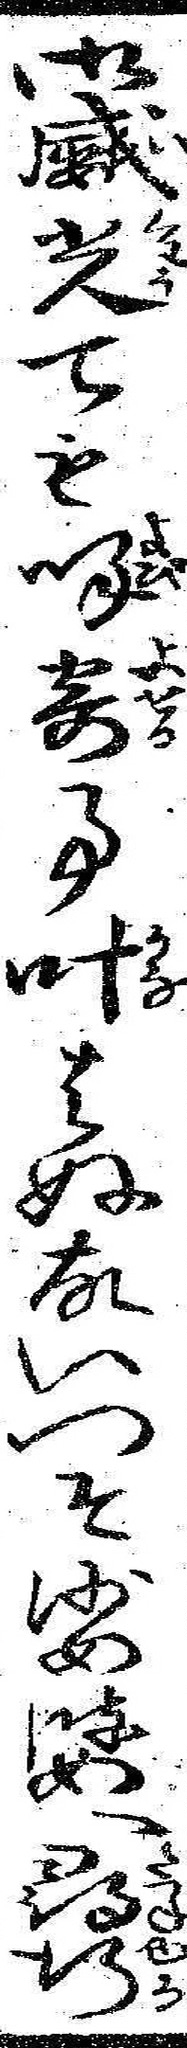御威光ても呼寄事叶はぬ故いつそ娑婆へ尋行
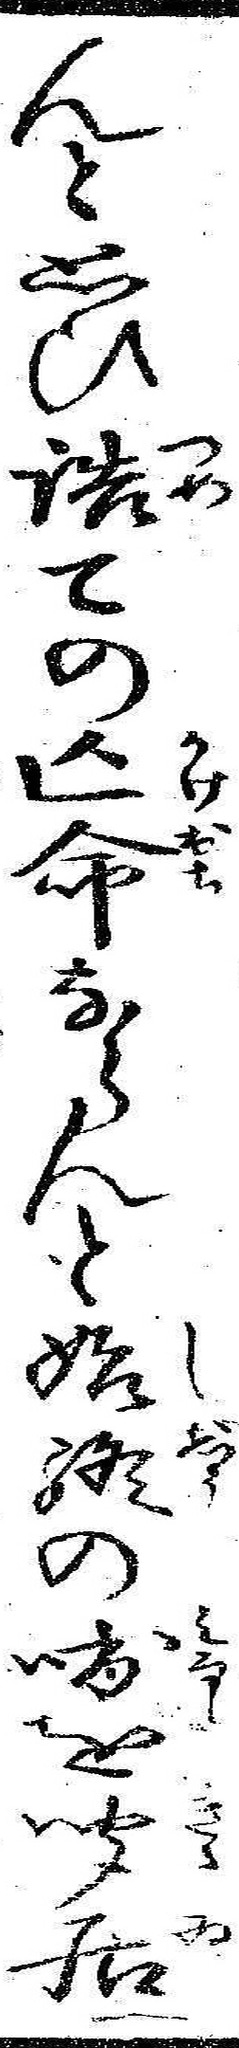んと思ひ詰ての亡命ならんと始終の咄を聞居
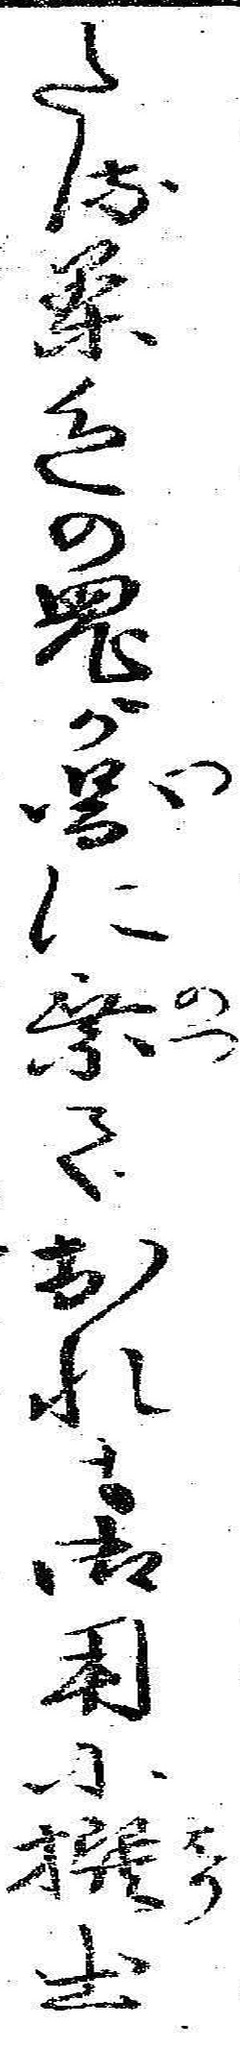たる茶色の鬼が図に乗ておれも御用に撰出
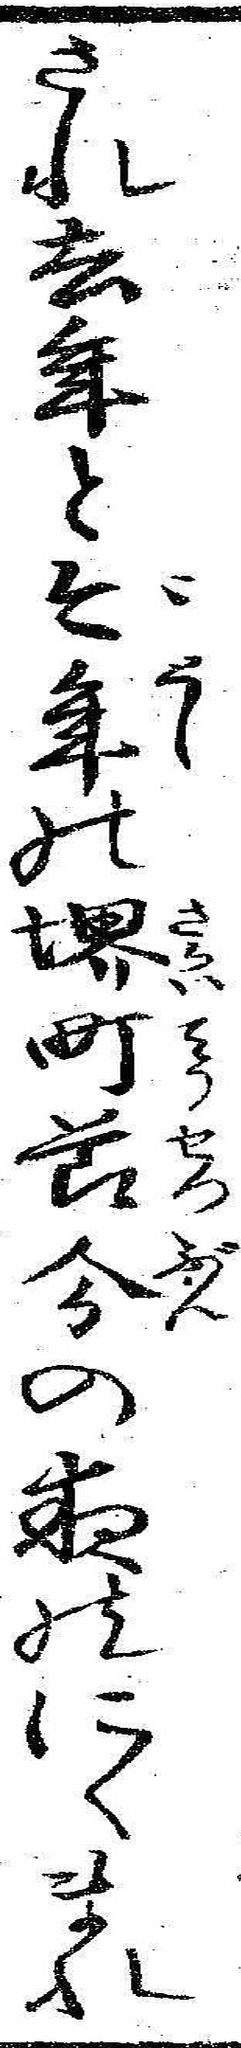され去年今年の堺町節分の夜のにくまれ
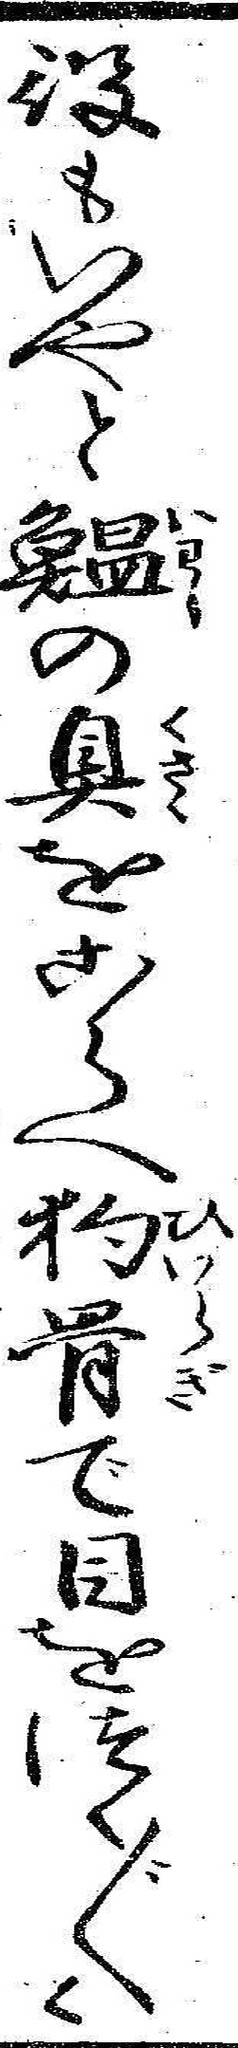役もいやと鯔の臭をこらへ狗骨で目をつく〲と
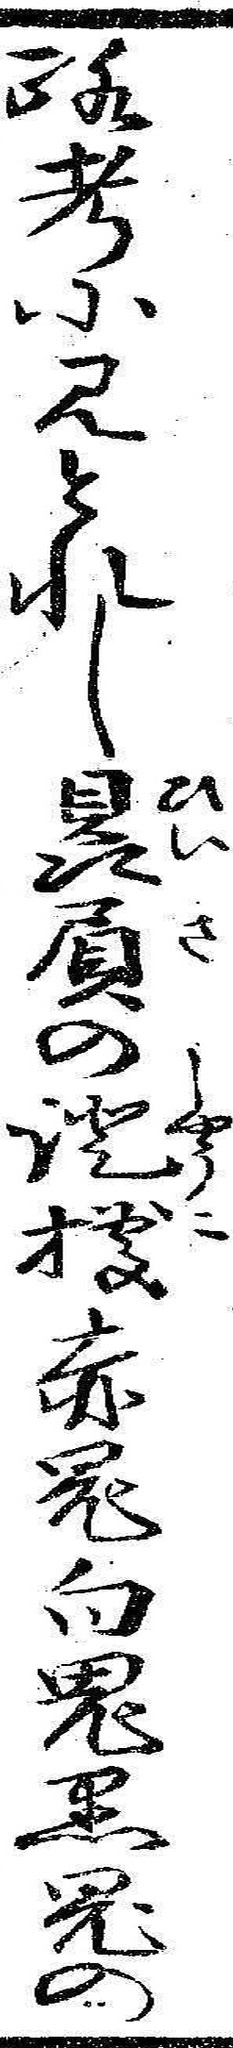路考に見とれし贔屓の証拠赤鬼白鬼黒鬼の
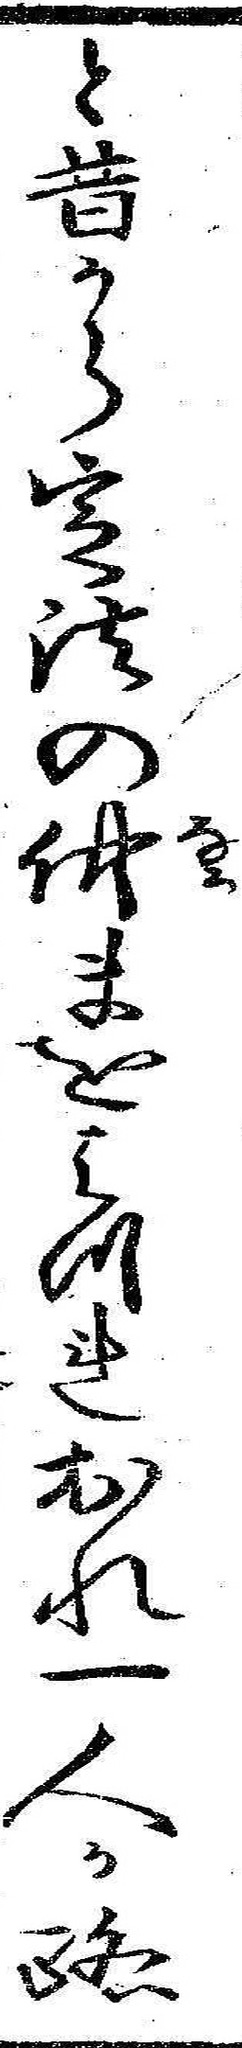と昔から定法の仲まをはつれおれ一人か路
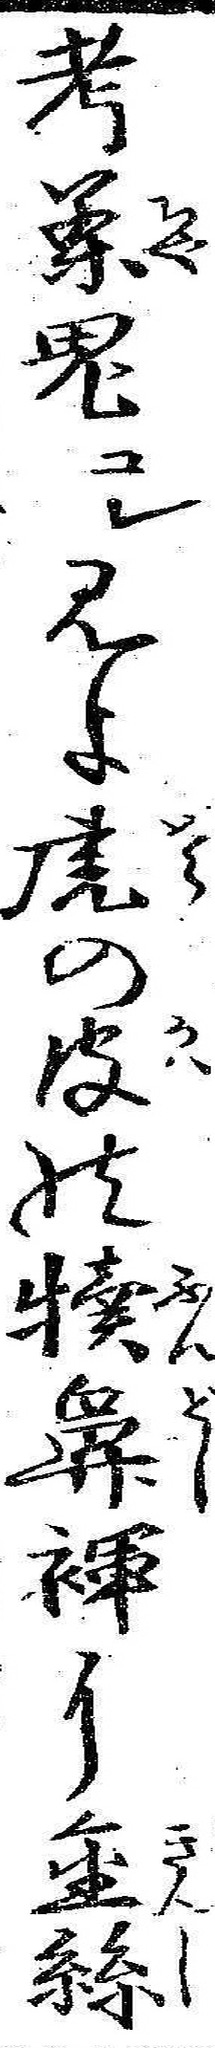考茶鬼見よ虎の皮の犢鼻褌に金糸
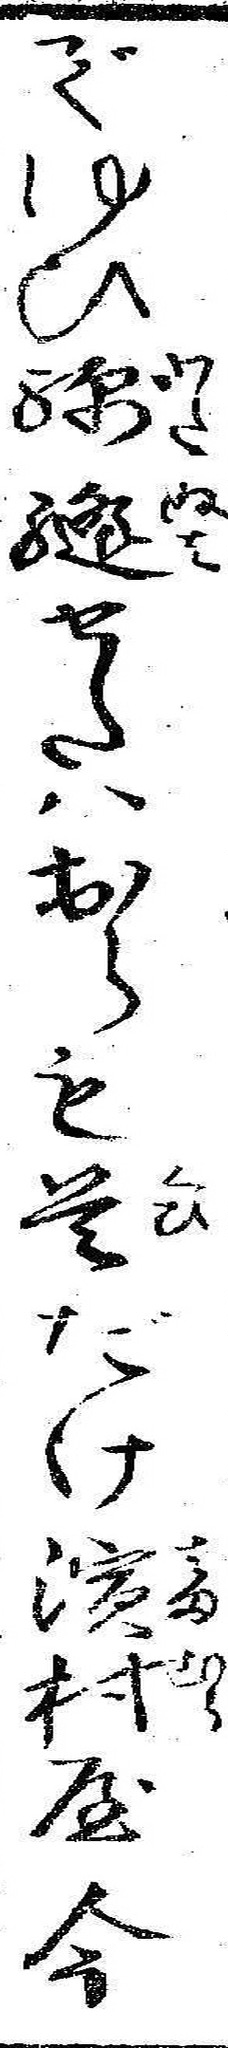でゆひ綿縫せたはおらも首だけ浜村屋今
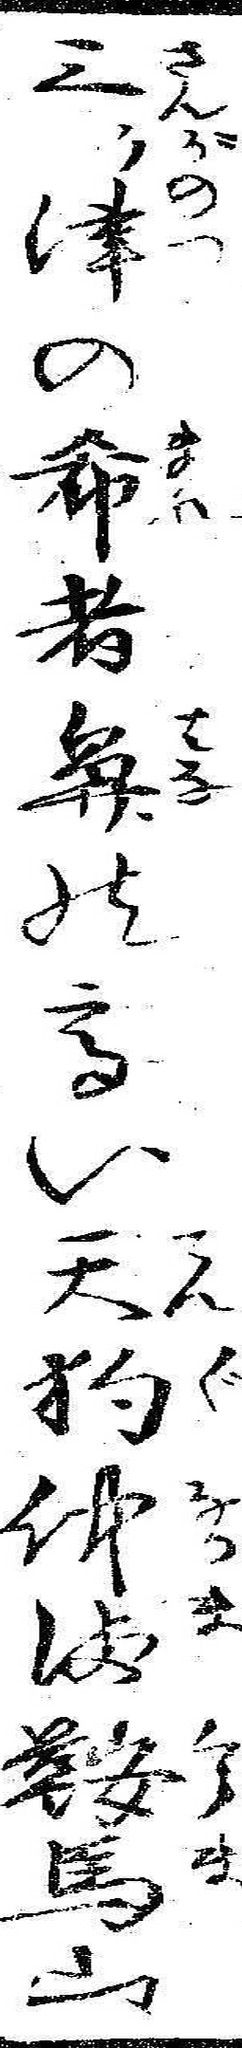三ヶ津の希者鼻の高い天狗仲満鞍馬山
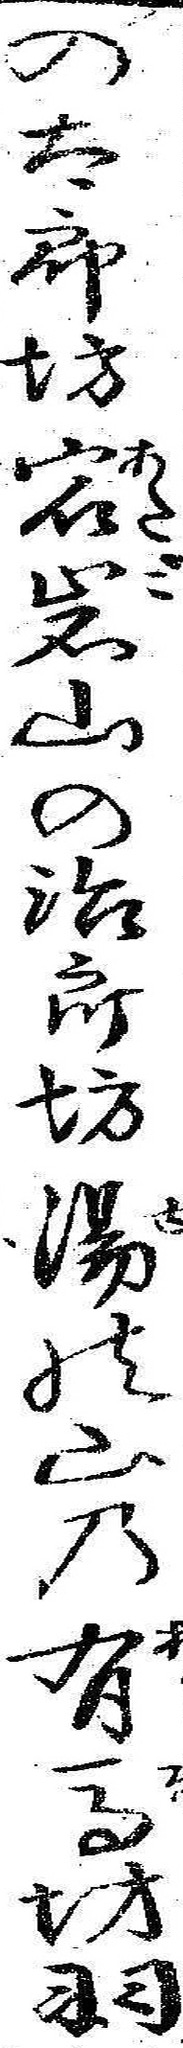の太郎坊愛宕山の治郎坊湯の山の有馬坊羽
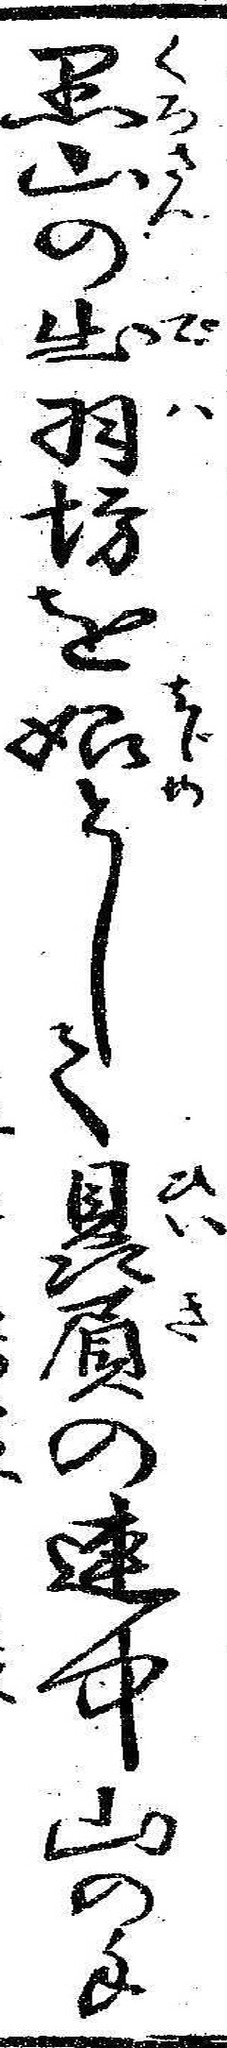黒山の出羽坊を始として贔屓の連中山の手
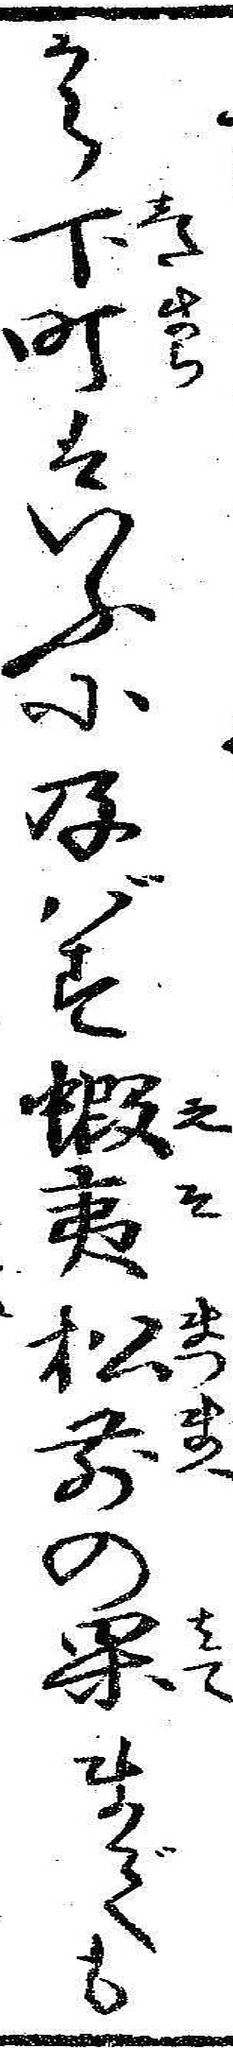から下町はいふに及ばす蝦夷松前の果までも
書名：根無草後編
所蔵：国文学研究資料館
